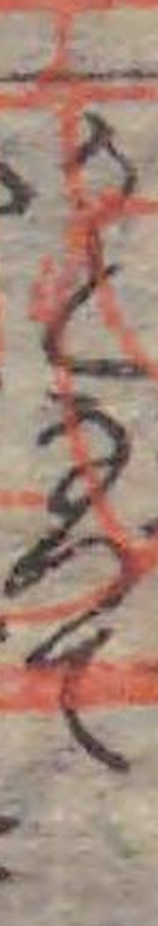かとなつて
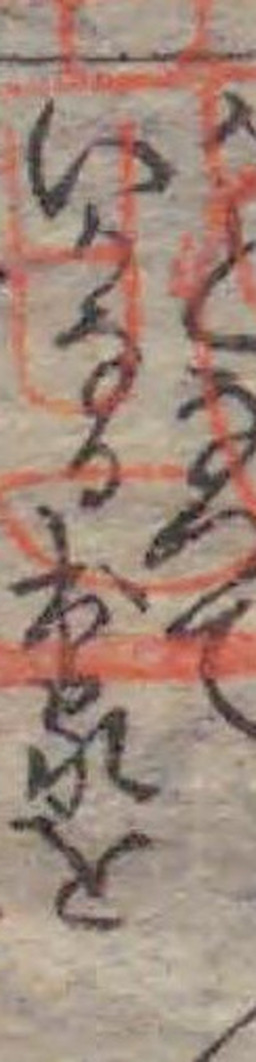いかなる出家を
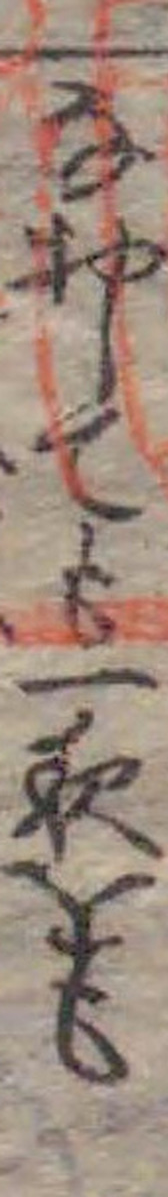なおしても一夜をも
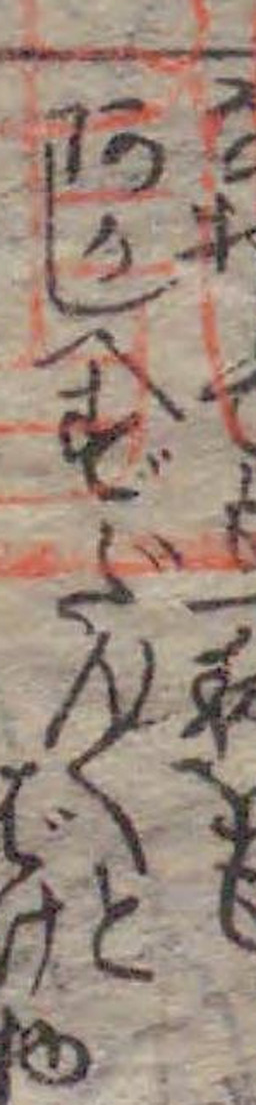あかしへずだん〳〵と
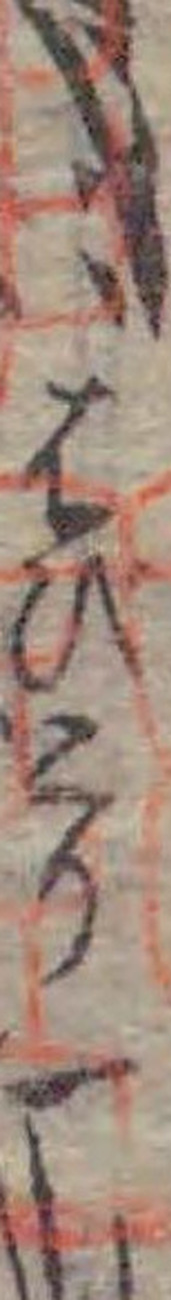はびこり
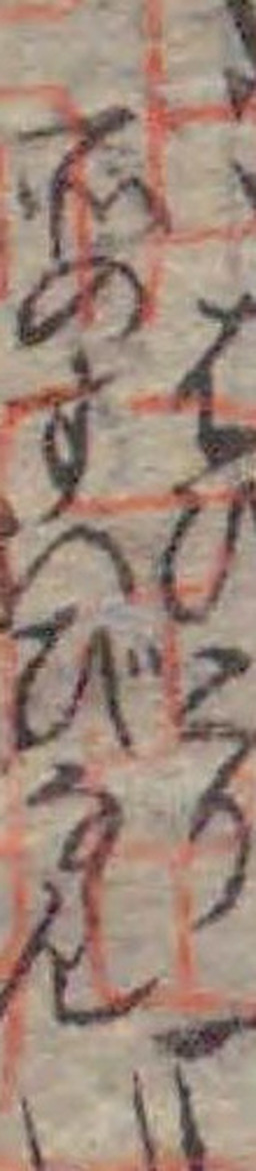所のすいびならん
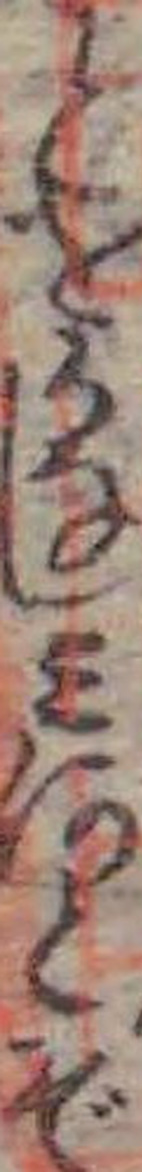ことをかなしみ何とぞ
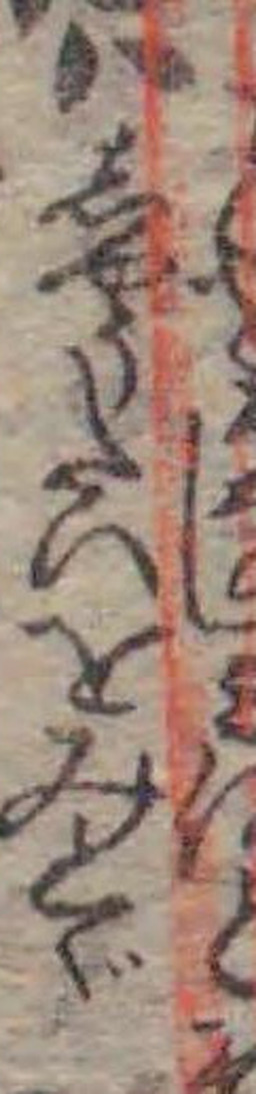しやうたいをみとゞ
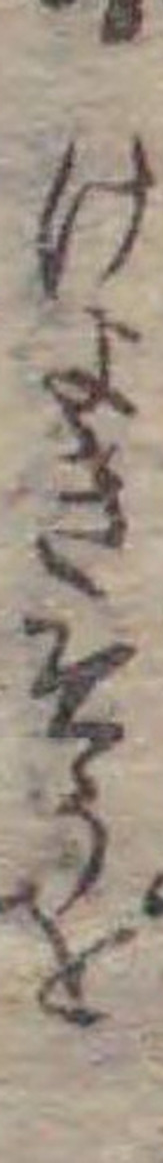けよきそうを
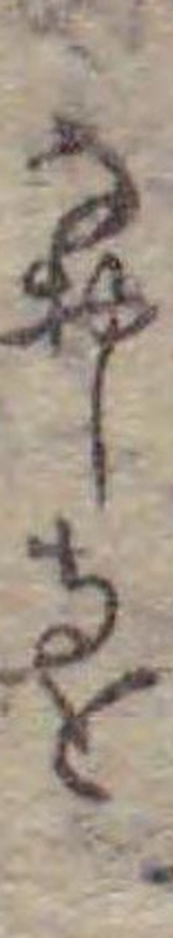なおし寺を
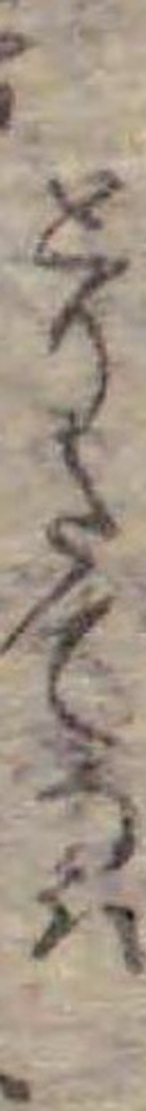とりたてるは
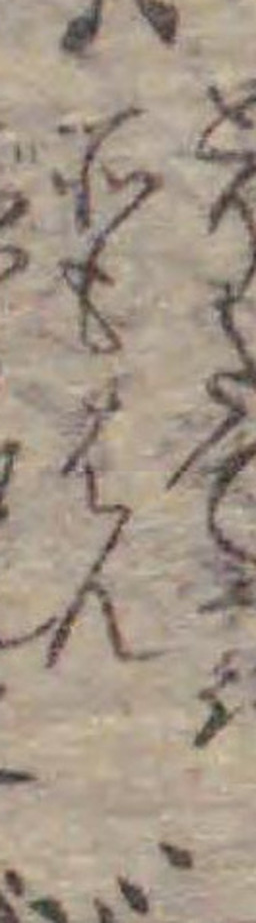所もはん
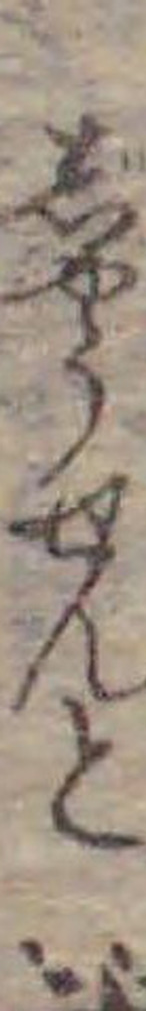じやうせんと

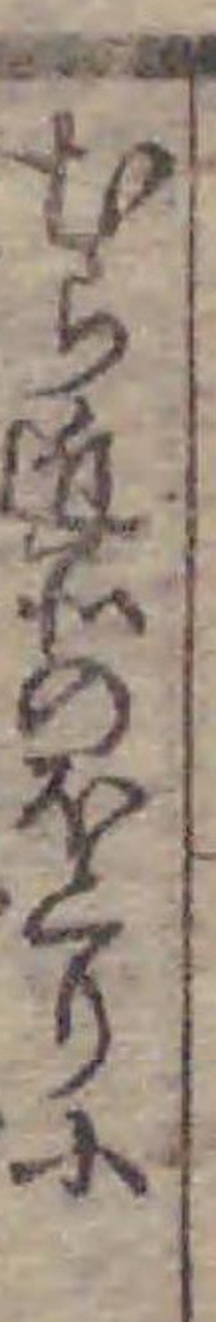むら近所のほとりに
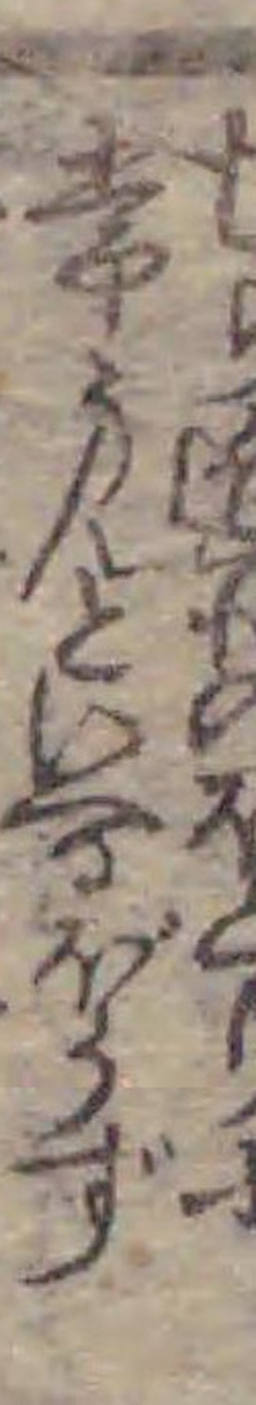しやうんといへるぼうず
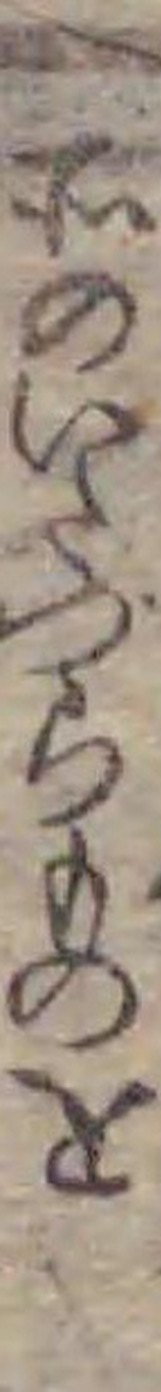所のいたづらものを
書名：歌の化物一寺再興 : 2巻
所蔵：国立国会図書館 National Diet Library, JAPAN
